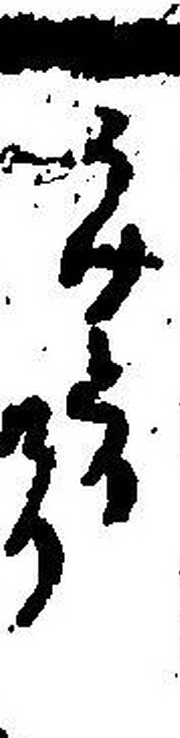うけとり

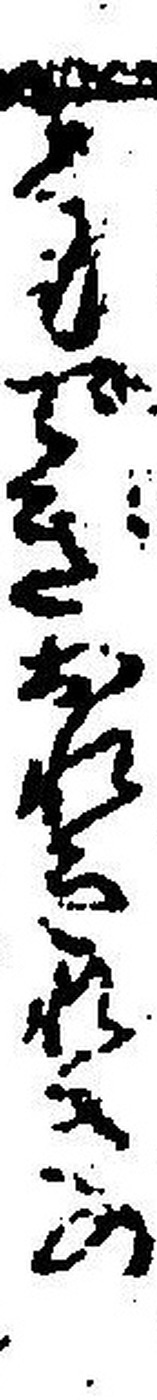くもできおれきれきの
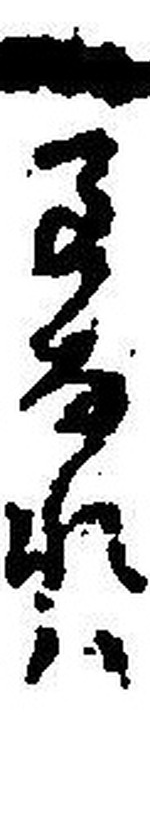事なれは
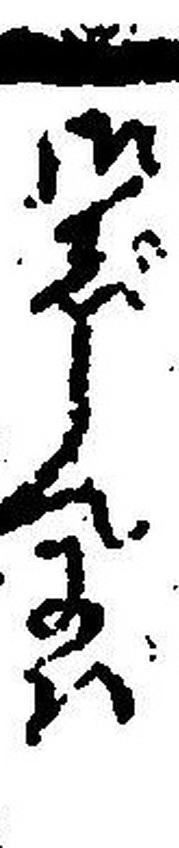御じしんには
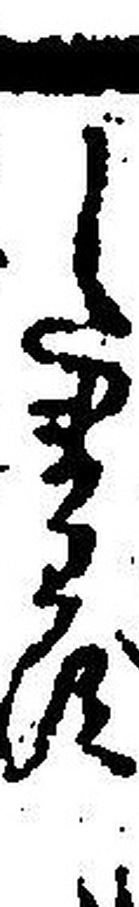したまわず
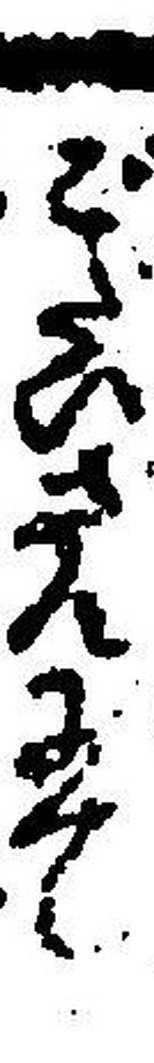ごだいさんにて
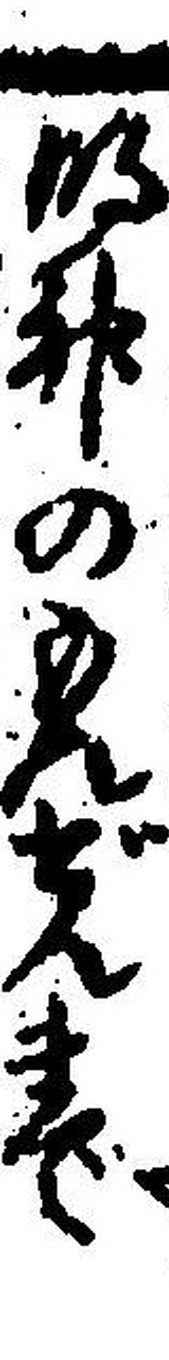明神のもんぜんまで
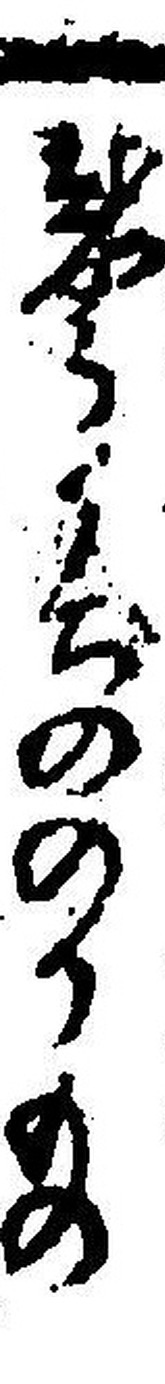ひやううちののりもの
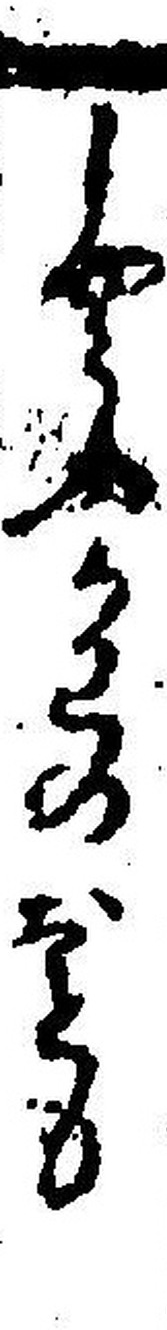しやうふかわのおとも
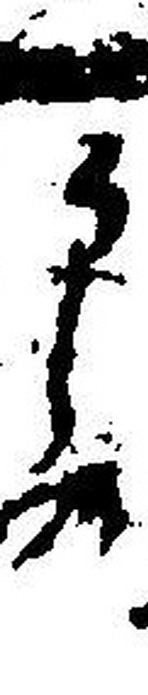うしの
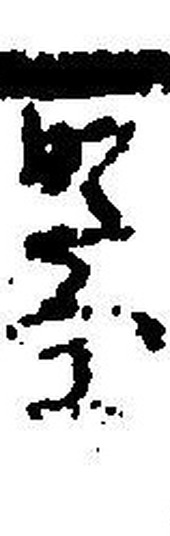かたへに
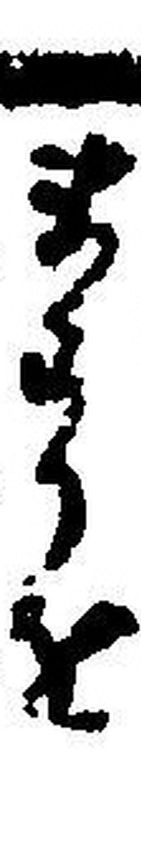まわりを
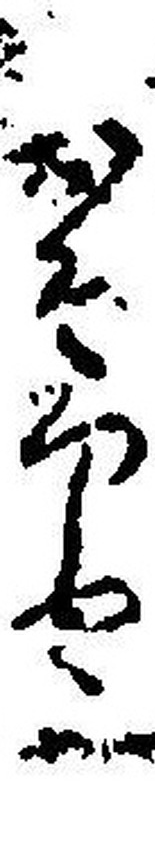おそろしや
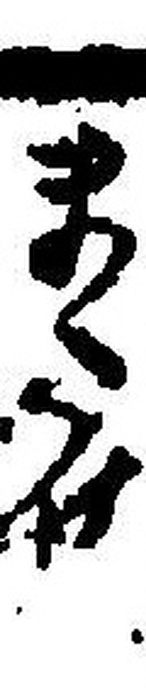またせ
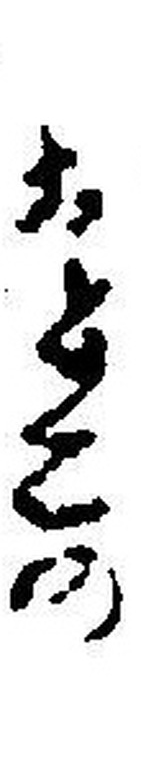おとこの
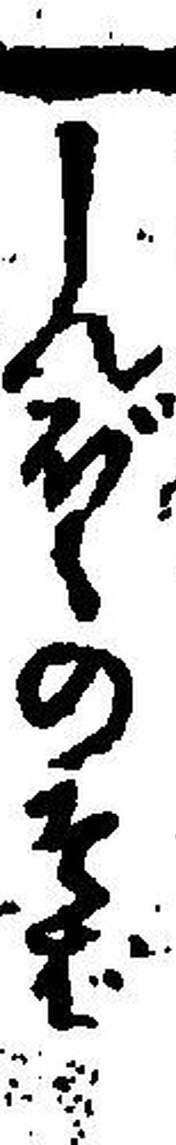しんぼくのそば
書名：御代参牛時詣 / 市場通笑作
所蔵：東京大学総合図書館 General Library in the University of Tokyo, JAPAN
